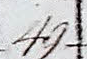49
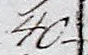40
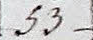53
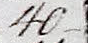40
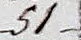51
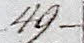49
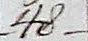48
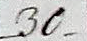30
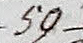59
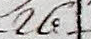26
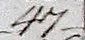47
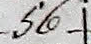56
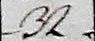32
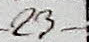23
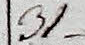31
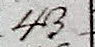43
